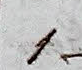1
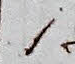1
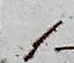1
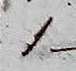1
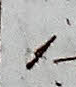1
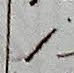1
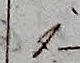1
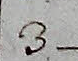3
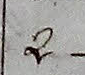2
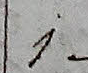1
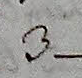3
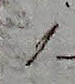1
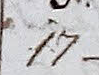17
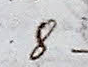8
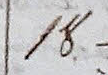18
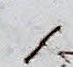1
